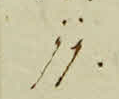11.
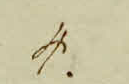4.
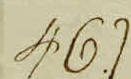46.
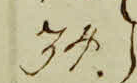34.
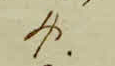4.
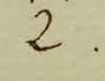2
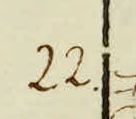22.
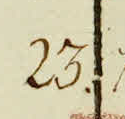23.
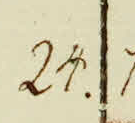24.
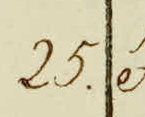25.
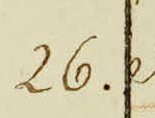26.
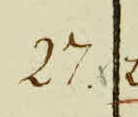27.
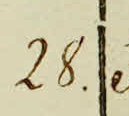28.
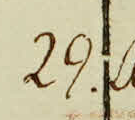29.
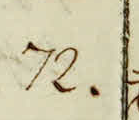72.
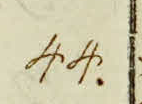44.
